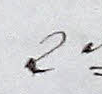2
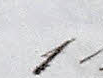1
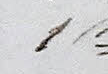1
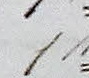1
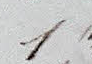1
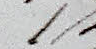1
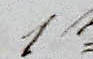1
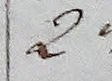2
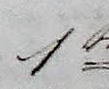1
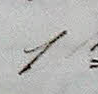1
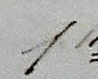1
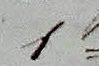1
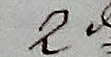2
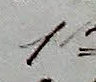1
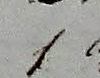1
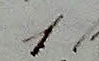1
